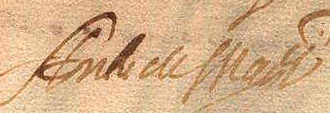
Anto de Mages
